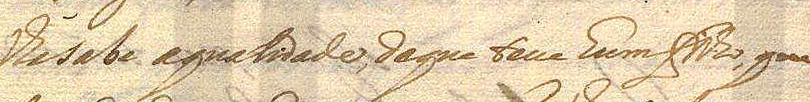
lhe sabe a qualidade, de que teue hum filho, que
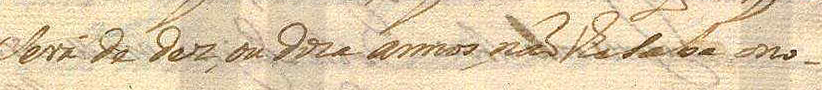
será de dez, ou doze annos, naõ lhe sabe o no
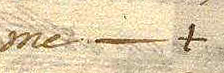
me - +
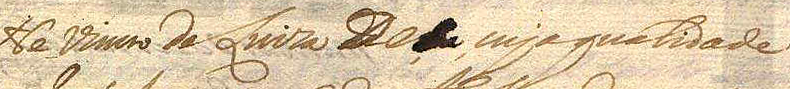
He viuuo de Luiza de eça, cuja qualidade
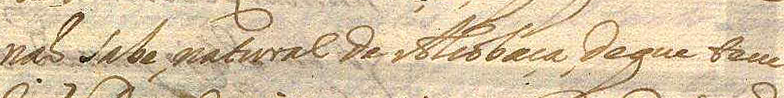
naõ sabe, natural de Alcobaça, de que teue
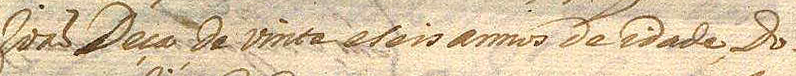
Joaõ Deça de vinte e seis annos de idade, Do
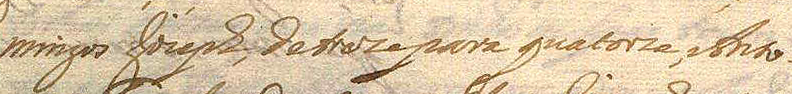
mingos Jozeph, de treze para quatorze, Anto
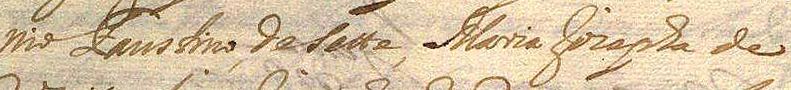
nio Faustino, de sette, Maria Jozepha de
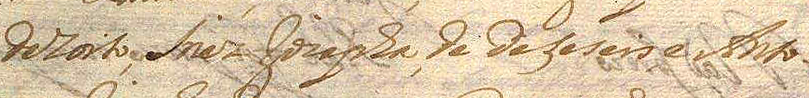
dezoito, Inez Jozepha, de dezaseis, e Anto
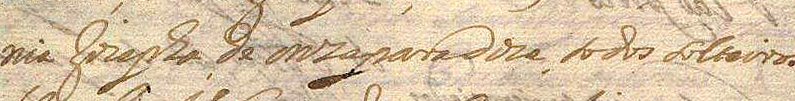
nia Jozepha, de onze para doze, todos solteiros
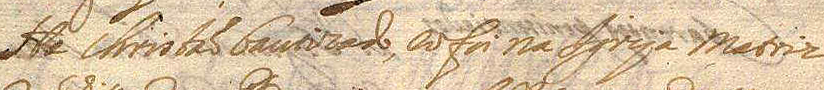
He christaõ bautizado, e o foi na Igreja matriz
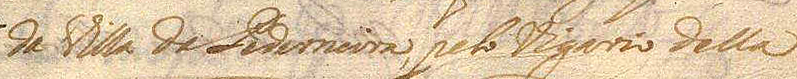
da Villa da Pederneira, pelo Vigario della
